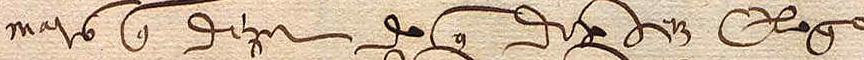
majs q̄ dizer do q̄ dito tem E logo
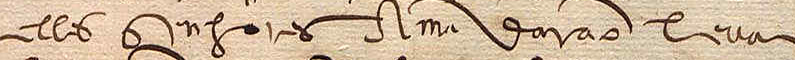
elles Senhores A mādarão leuar
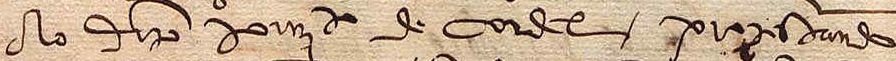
Ao dit̄o tormto de cordel / protestando
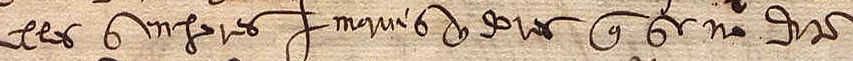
elles Senhores Jmquisydores q̄ se no dito
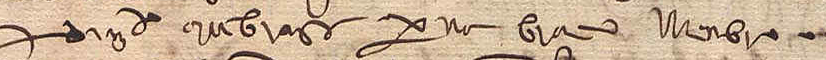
tormto quebrase ꝑna braco menbro ou
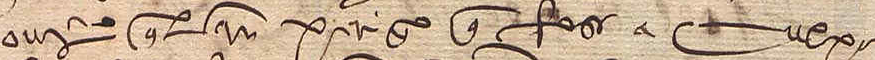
outro q̄lq̄r perigo q̄ fose a Culpa
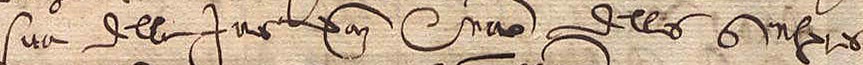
Sua della Jnes Vāz e não delles Senhores
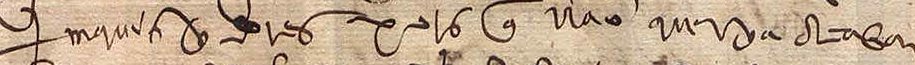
Jmquisydores pojs q̄ não querya Acabar
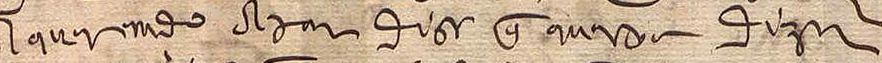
A queremdo Atar dise q̄ querya dizer
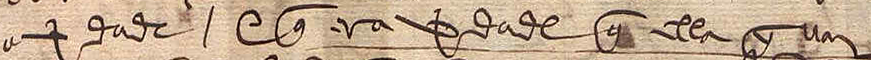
a ꝟdade / e q̄ era ꝟdade q̄ ella guar
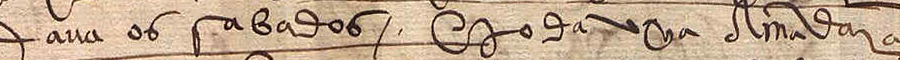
daua os sabados /. e todavya Amādara
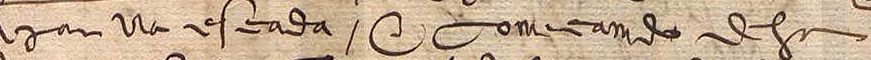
Atar na escada / e comecamdo deha
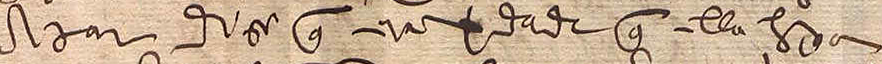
Atar dise q̄ era ꝟdade q̄ ella hya
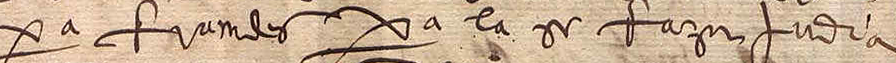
ꝑa framdes ꝑa la se fazer Judia
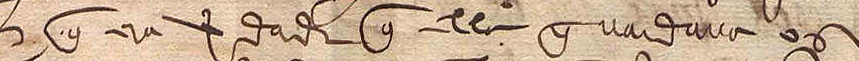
e q̄ era ꝟdade q̄ ella guardaua os
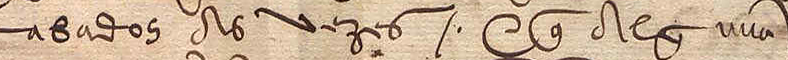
sabados As vezes /. e q̄ Alguūa
